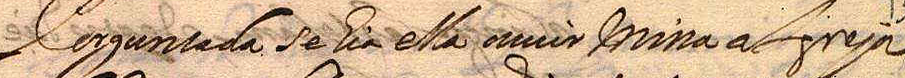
Perguntada se hia ella ouuir missa a Igreja
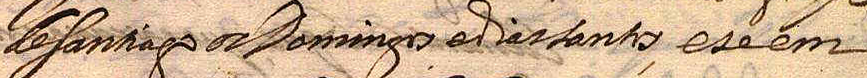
de Santiago os Domingos e dias santos, e se em
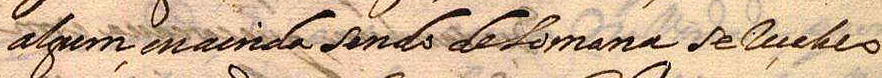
algum, ou ainda sendo de somana se Reçebeo
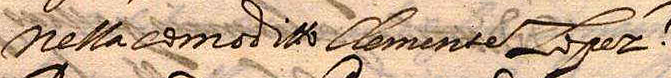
nella com o ditto Clemente Lopez?
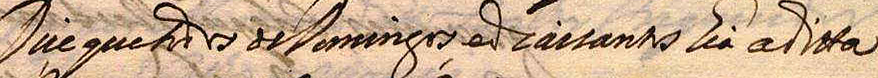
Diçe que todos os Domingos, e dias santos hia a ditta
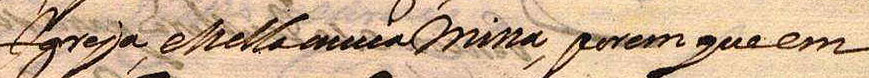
Jgreja, e nella ouuia missa, porem que em
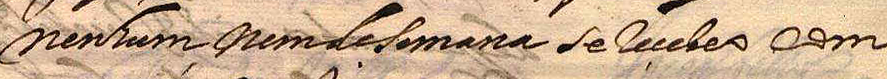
nenhum, nem de semana se Reçebeo com
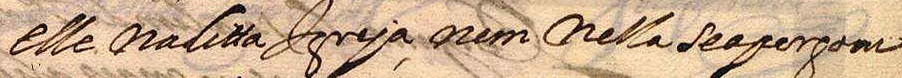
elle na ditta Igreja, nem nella se apergoou
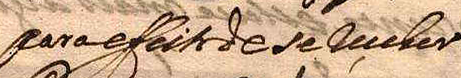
para effeito de se reçeber.
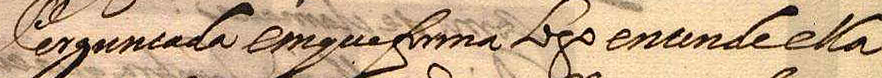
Perguntada em que forma logo entende ella
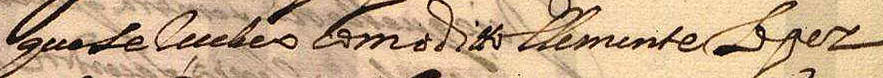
que se Reçebeo com o ditto Clemente Lopez
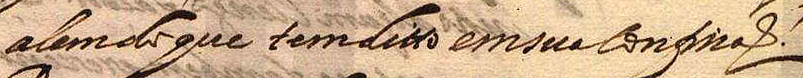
alem do que tem ditto em sua confissaõ?
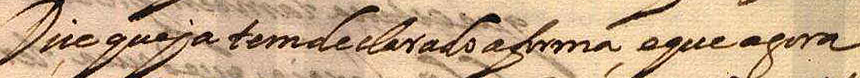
Diçe que ja tem declarado a forma, e que agora
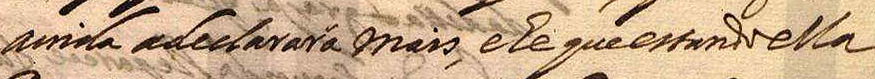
ainda a declarara mais, e he que estando ella
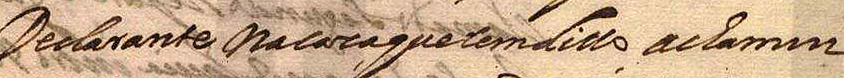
Declarante na caza, que tem ditto, a chamou
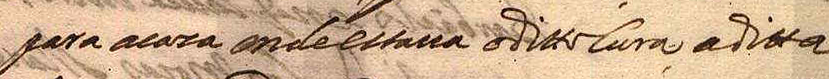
para a caza onde estaua o ditto Cura, a ditta
